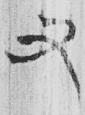又（有）
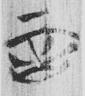言
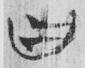曰
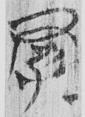君子
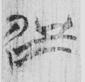○（強）
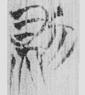則
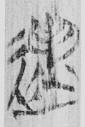○（遺）
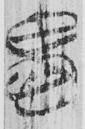○（愄）
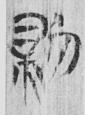則
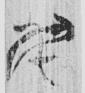民
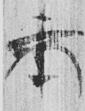不
